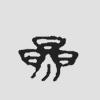參
